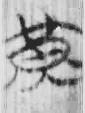黃
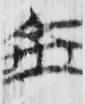金
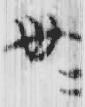三十
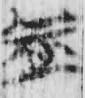益
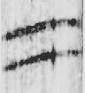二
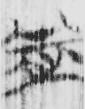益
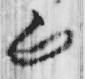㠯（以）
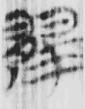翟（糴）
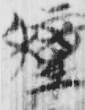穜（種）
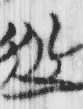迄
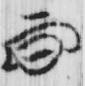○（期）
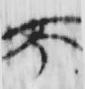不
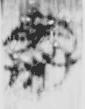賽
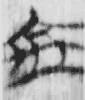金
